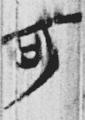可（何）
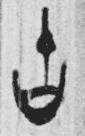古（故）
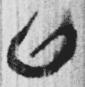㠯（以）
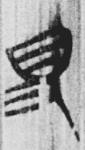○（得）
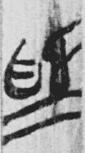爲
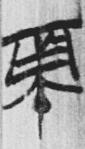帝
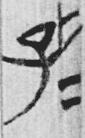孔子
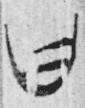曰
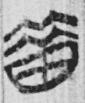昔
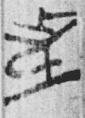者
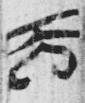而
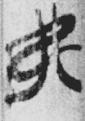弗
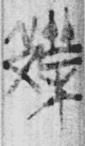○（世）
